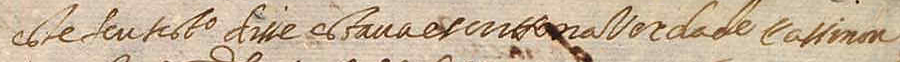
este seu testo disse estaua escritto na Verdade E assinou
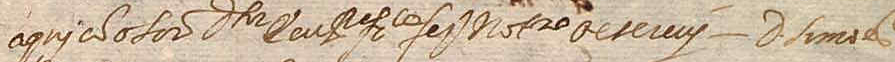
aquj cō o sor Dtor E eu Pe frco fez̄ Notro o escreuj – D. Simões
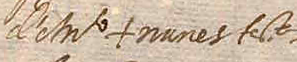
d'Anto + nunes test.a
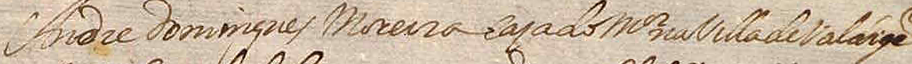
Andre domingues Moreira cazado Mor na Villa de Valdigē
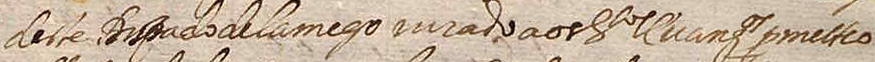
deste Bispado de lamego iurado aos Stos Euang.os ꝓmetteo
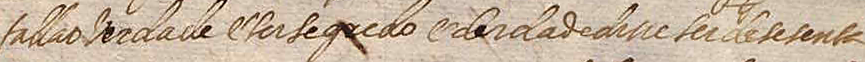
fallar verdade e ser segredo e de idade disse ser de sesenta
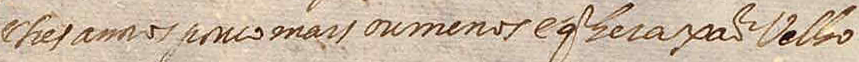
e tres annos pouco mais ou menos e q̄ era xpaõ Velho
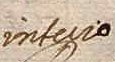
inteiro
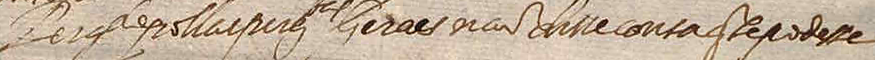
Pergdo pollas pergtas Geraes naõ disse cousa q̄ se podesse
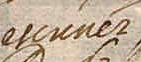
escreuer
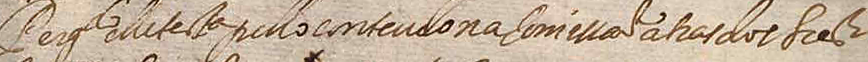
Pergdo elle testa pollo conteudo na Comissaõ atras dos sres̄
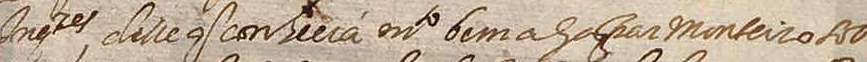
Inqres, disse q̄ conhecia mto bem a gaspar monteiro sob
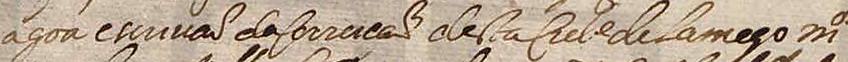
agoa escriuaõ da Correiçaõ desta Cide de Lamego mor
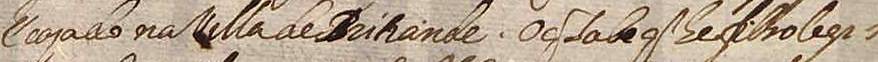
E cazado na villa de Britiande. O q̄ sabe q̄ he filho legi
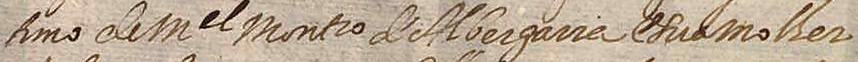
timo de Mel Montro d'Albergaria E sua molher
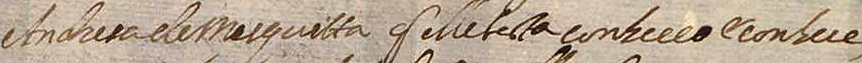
Andresa de mesquitta q̄ elle testa conheceo e conhece,
